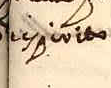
e espirito
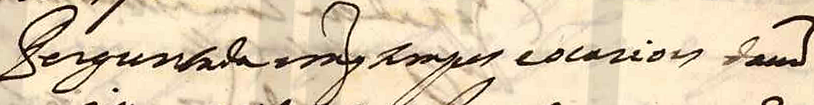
Perguntada em q̄ tempos, e ocazioes dauā
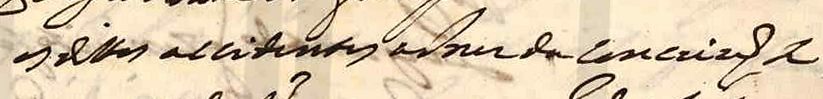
os dittos accidentes a Ines da conceiçaõ, se
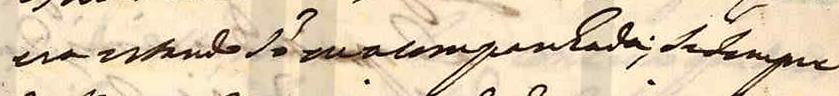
era estando só ou acompanhada; se sempre
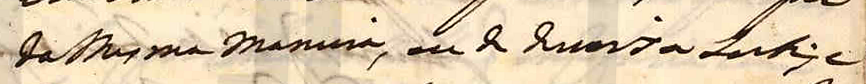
da mesma maneira, e de diuersa sorte; e
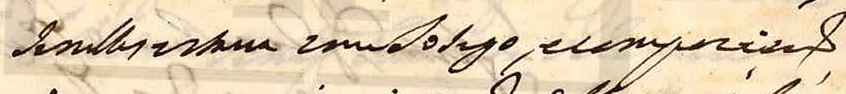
se nelles estaua com Sosego, e compoziçaõ
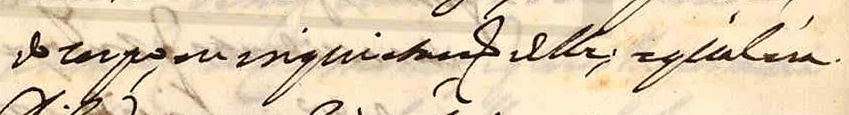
do corpo, ou inquietaçaõ delle; e qual era.
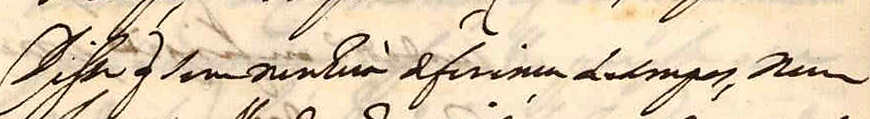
Disse q̄ sem nenhuā deferença de tempos, nem
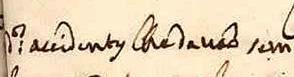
d.os accidente lhe dauaõ sem
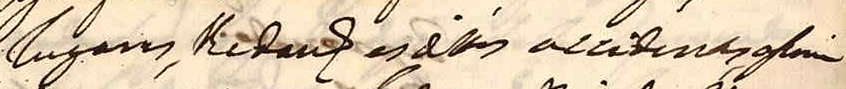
lugares, lhe dauaõ os dittos accidentes, assim
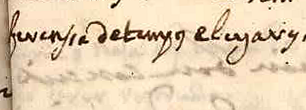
ferenssa de tempos e lugares
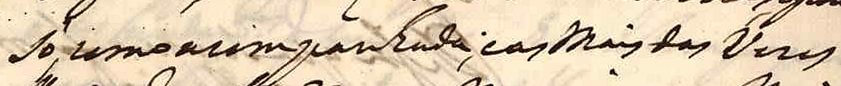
só, como acompanhada; e as mais das Vezes
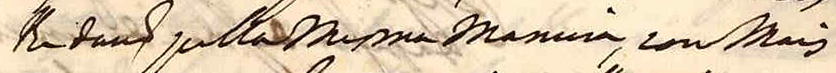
lhe dauaõ pella mesma maneira, com mais
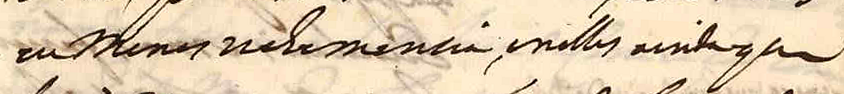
ou menos uehemencia, e nelles ainda que
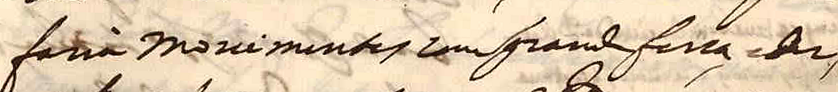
fazia mouimentos com grande força, e des,
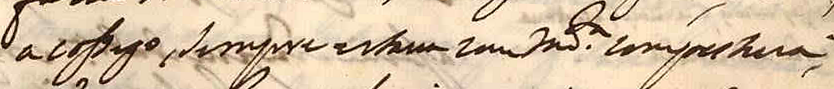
açossego, sempre estaua com m.ta compostura:
